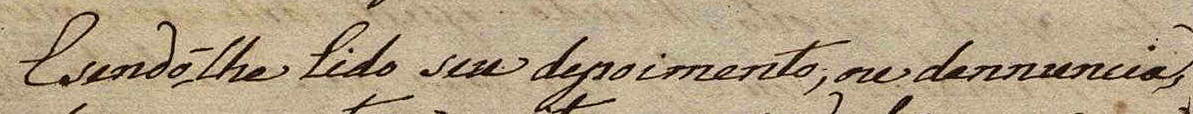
E sendo-lhe lido seu depoimento, ou dennuncia,
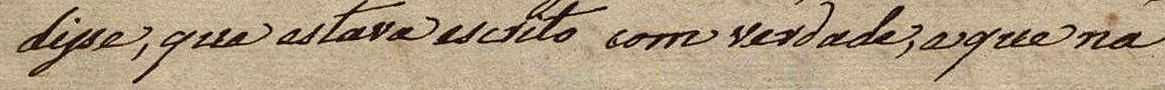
disse, que estava escrito com verdade, e que na
